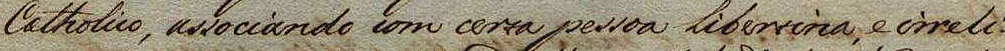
Catholico, associando com certa pessoa libertina, e irreli
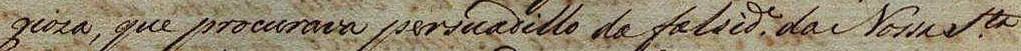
gioza, que procurava persuadillo da falsid.e da Nossa S.ta
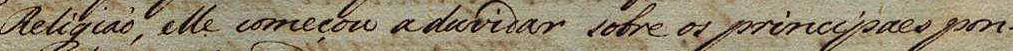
Religiaõ, elle começou a duvidar sobre os principaes pon
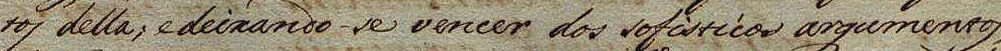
tos della; e deixando-se vencer dos sofisticos argumentos,
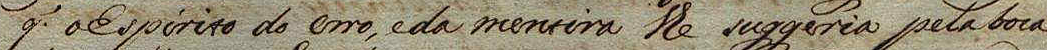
q̄ o Espirito do erro, e da mentira lhe suggeria pela boca
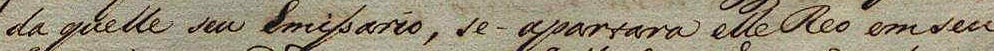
daquelle seu Emissario, se-apartara elle Reo em seu
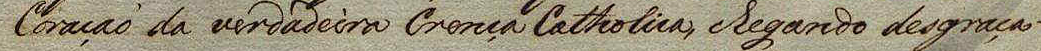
Coraçaõ da verdadeira Crença Catholica, chegando desgraça
